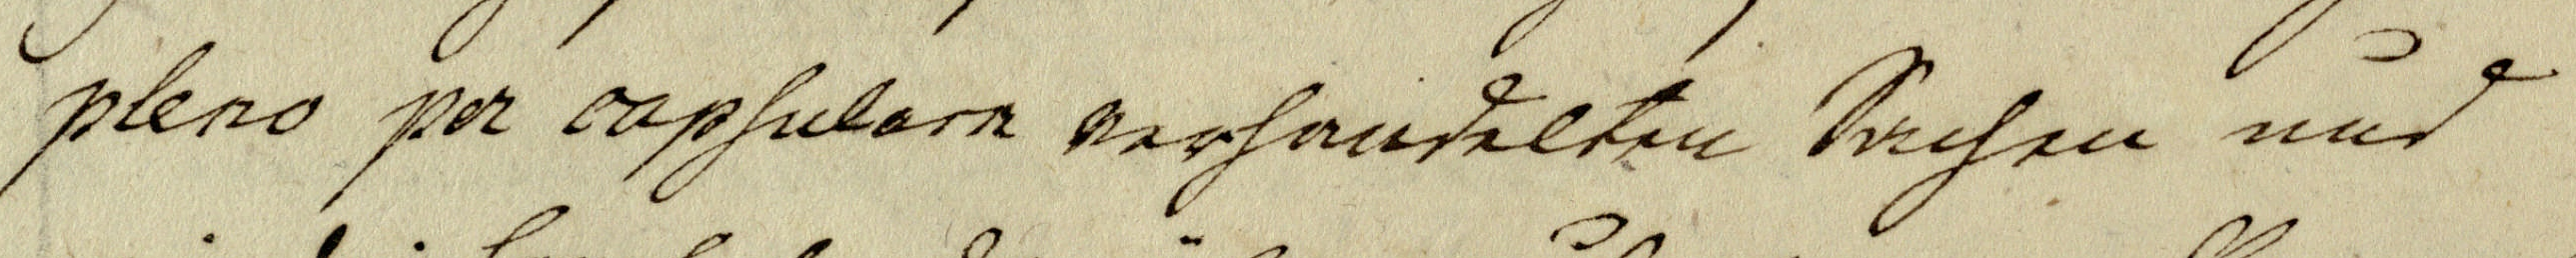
pleno per Capsulam verhandelten Sachen und
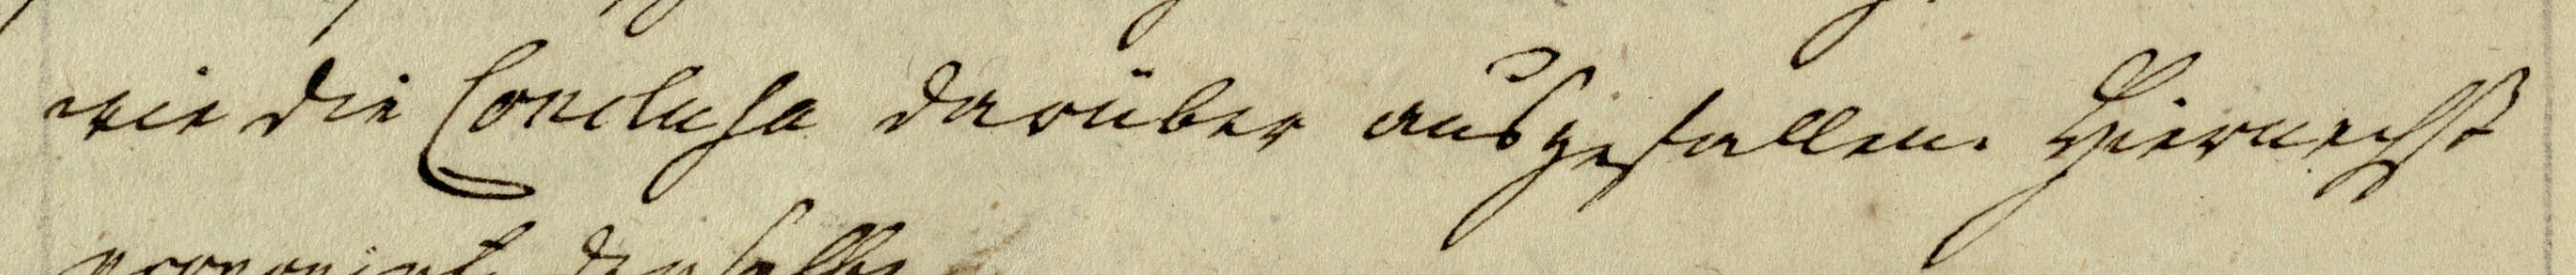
wie die Conclusa darüber ausgefallen. Hiernechst
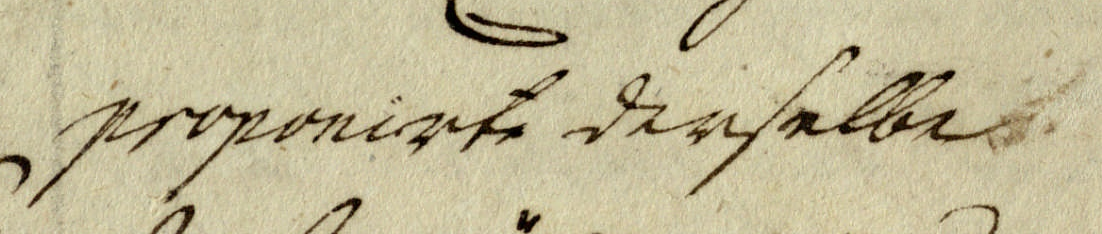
proponirte derselbe
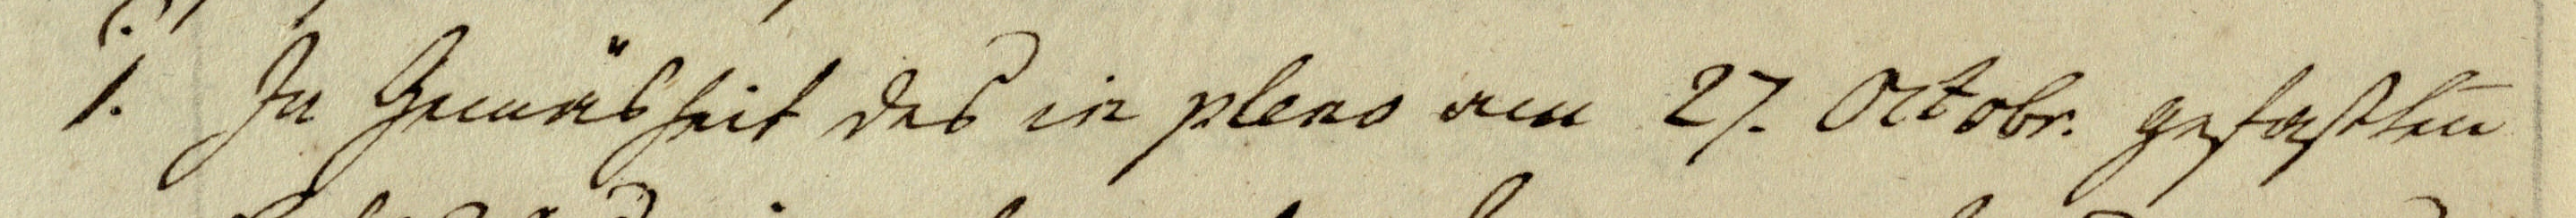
1. In Gemäsheit des in pleno am 27. Octobr. gefaßten
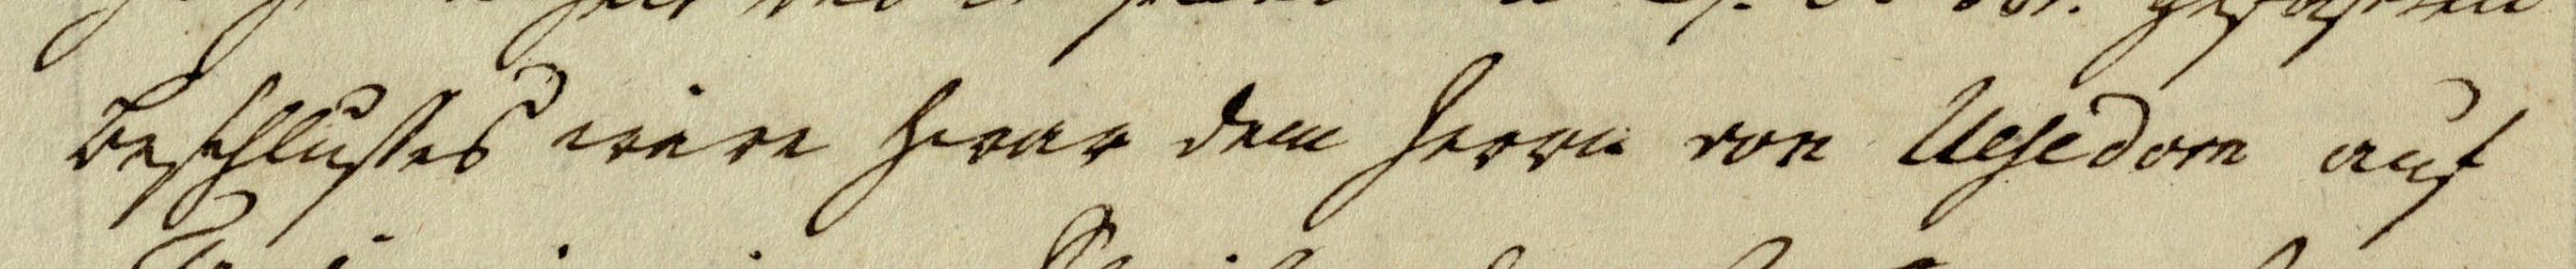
Beschlusses wäre zwar dem Herrn von Uesedom auf
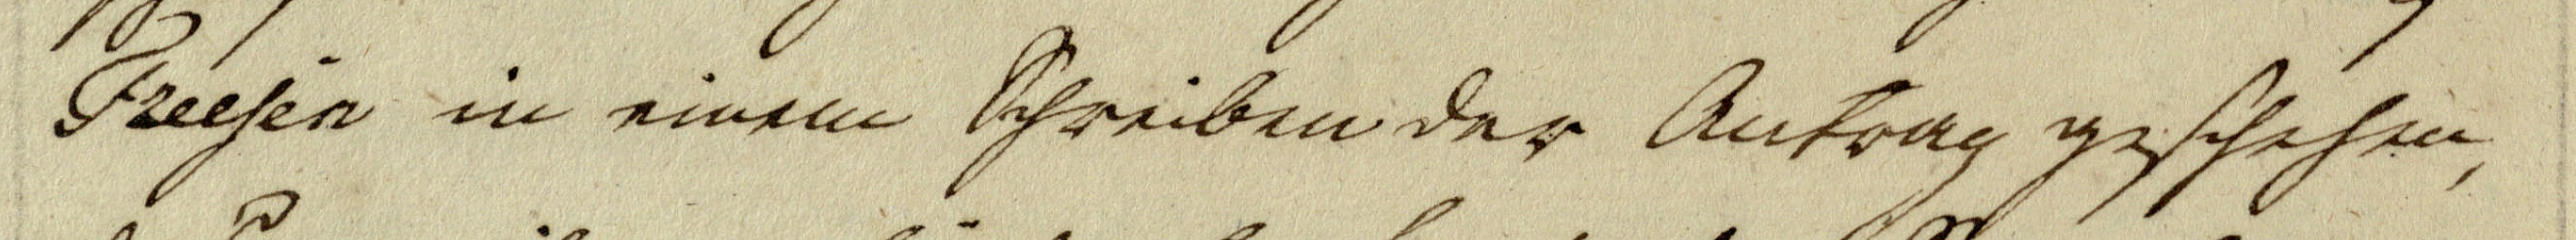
Freesen in einem Schreiben der Antrag geschehen,
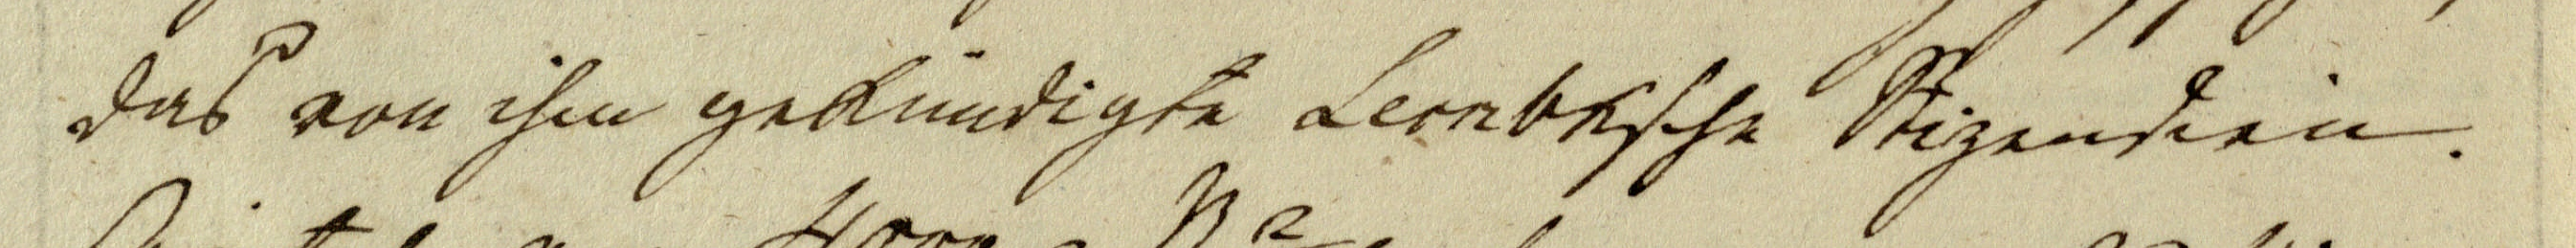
das von ihm gekündigte Lembksche Stipendien
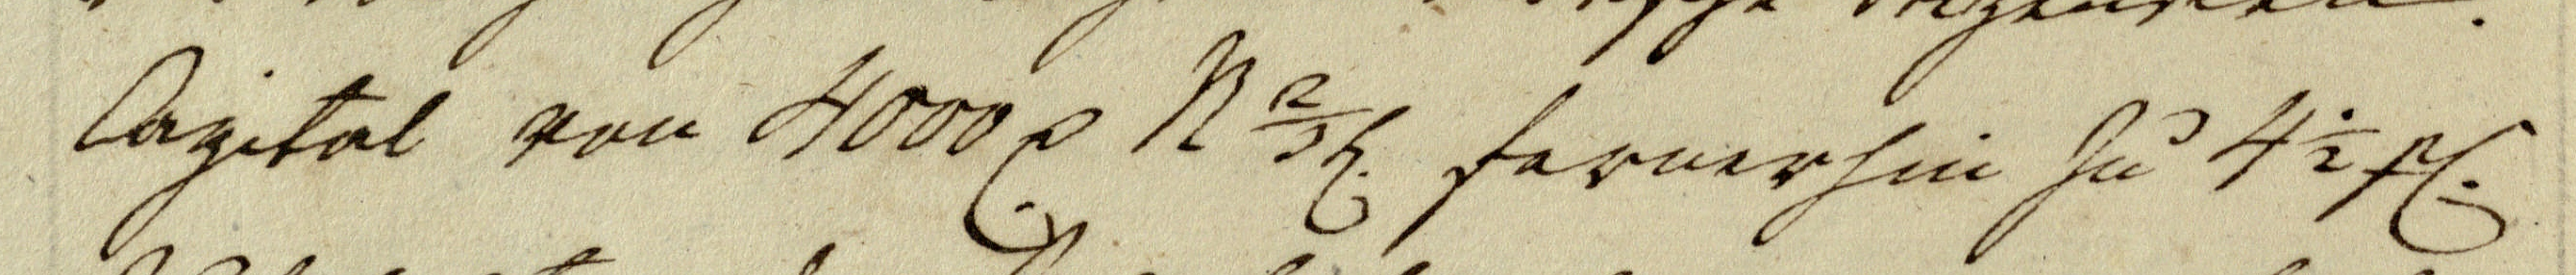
Capital von 4000 l. N ¾ h. fernerhin zu 4 ½ pl.
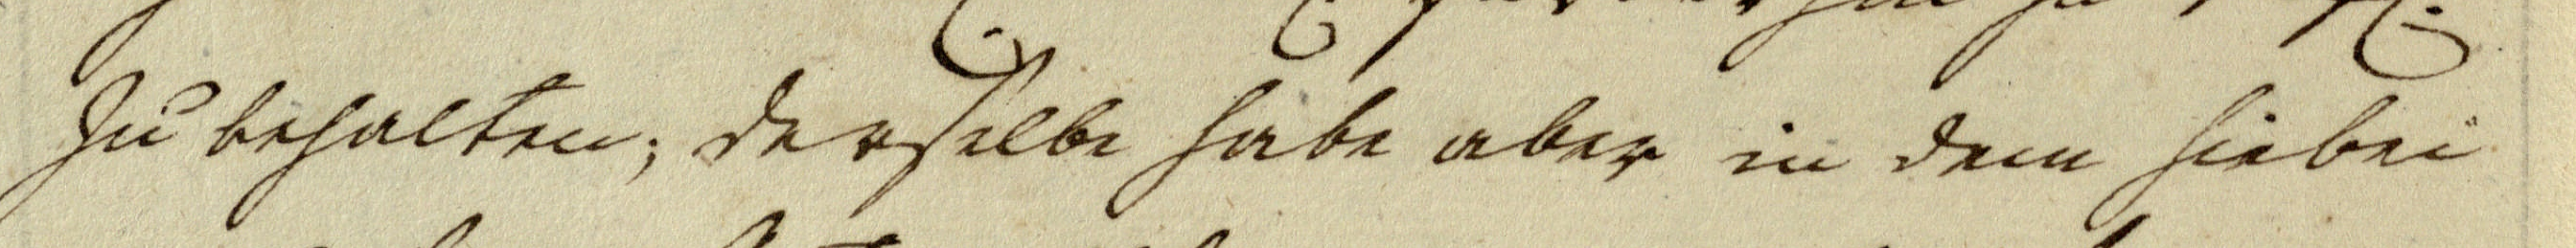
zu behalten; derselbe habe aber in dem hiebei
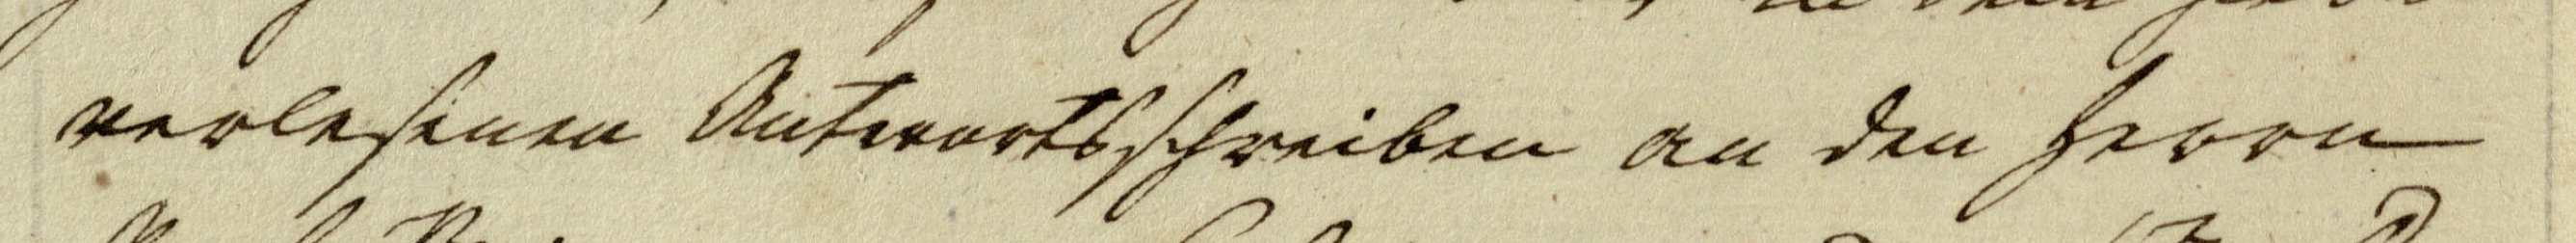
verlesenen Antwortsschreiben an den Herrn
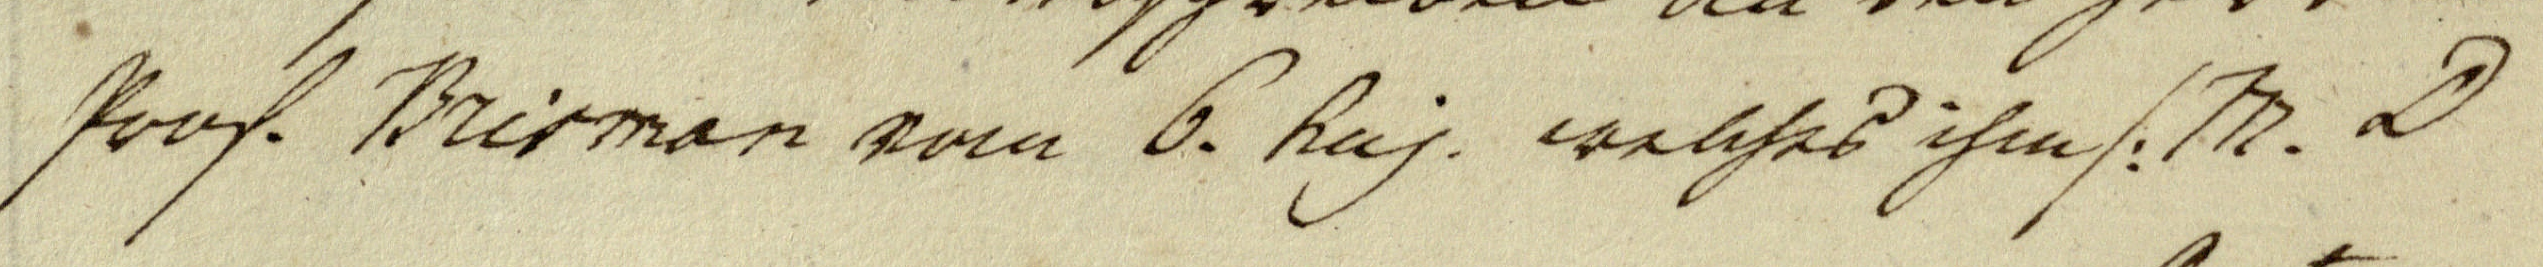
Prof. Brisman vom 6. huj. welches ihm /: M.D
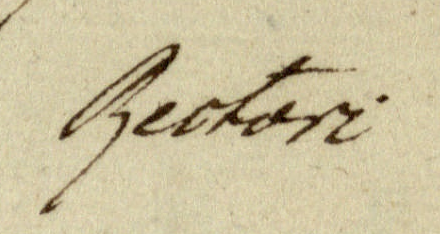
Rectori
